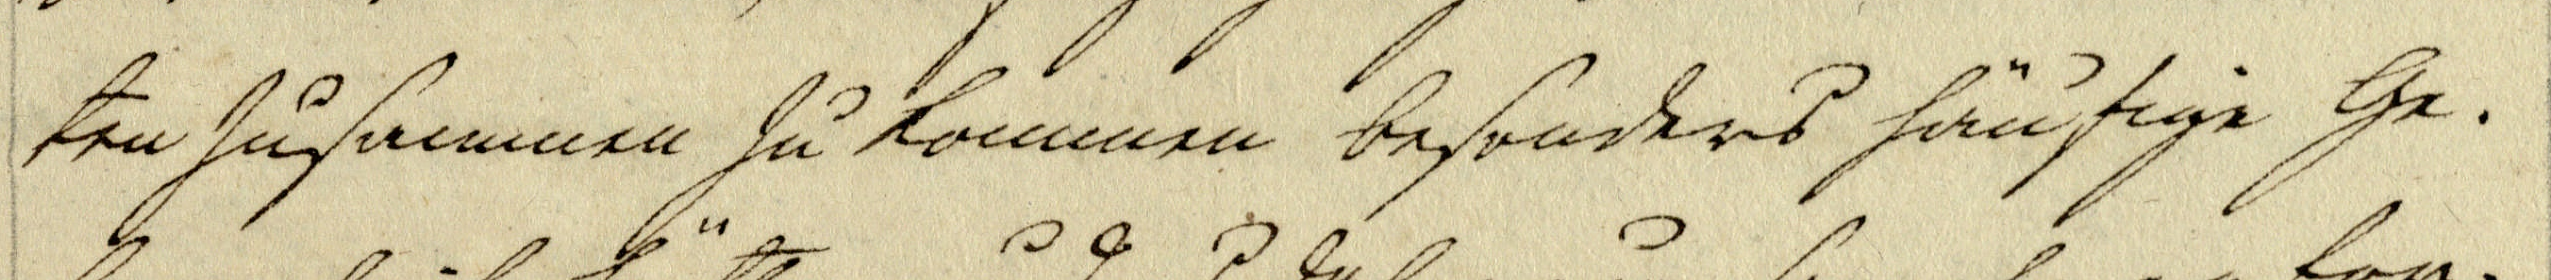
ten zusammen zu kommen besonders häufige Ge¬
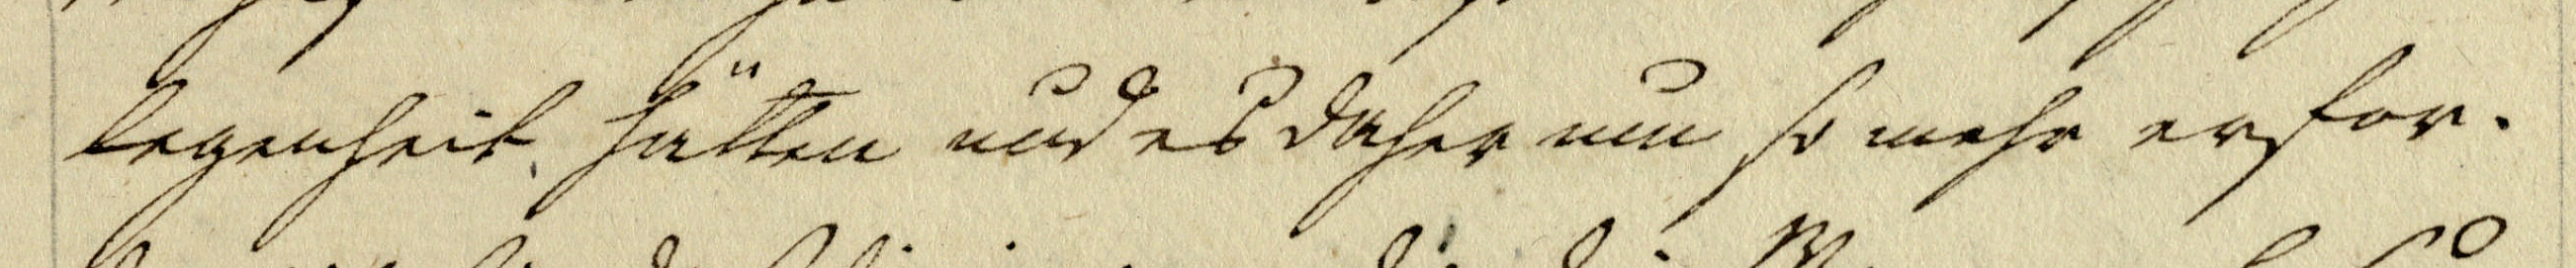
legenheit hätten und es daher um so mehr erfor¬
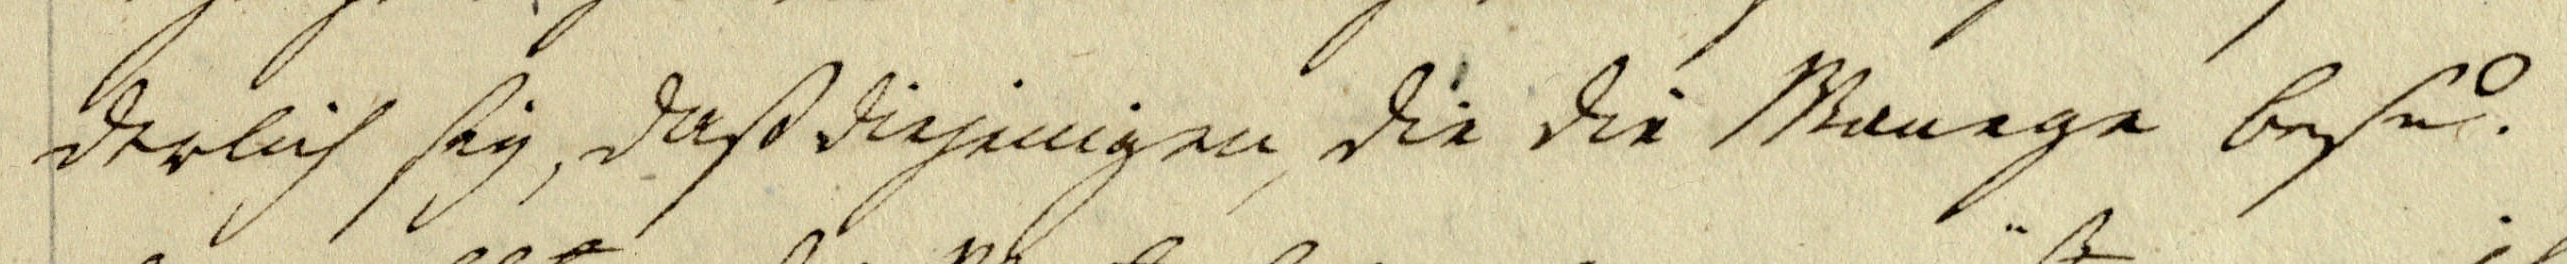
derlich seÿ, daß diejenigen die die Manege besu¬
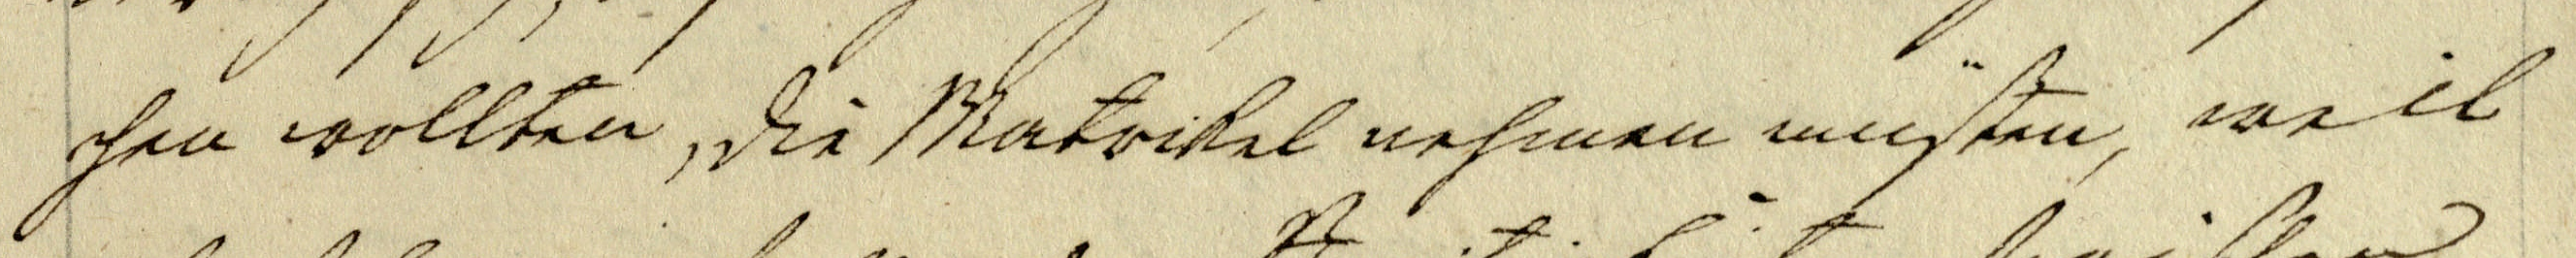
chen wollten, die Matrikel nehmen müßten, weil
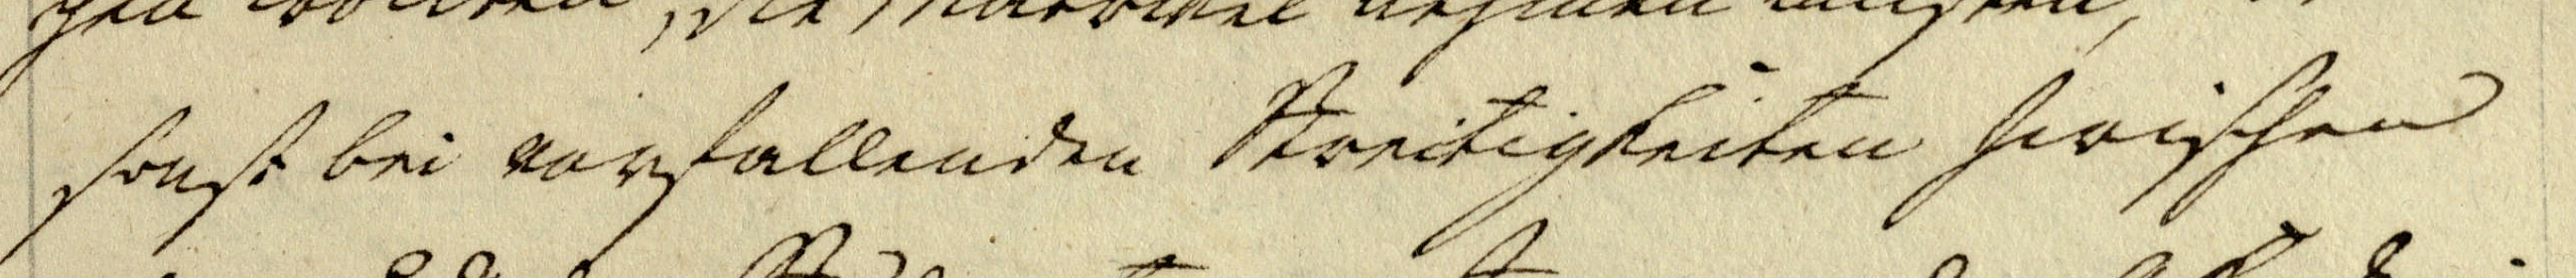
sonst bei vorfallenden Streitigkeiten zwischen
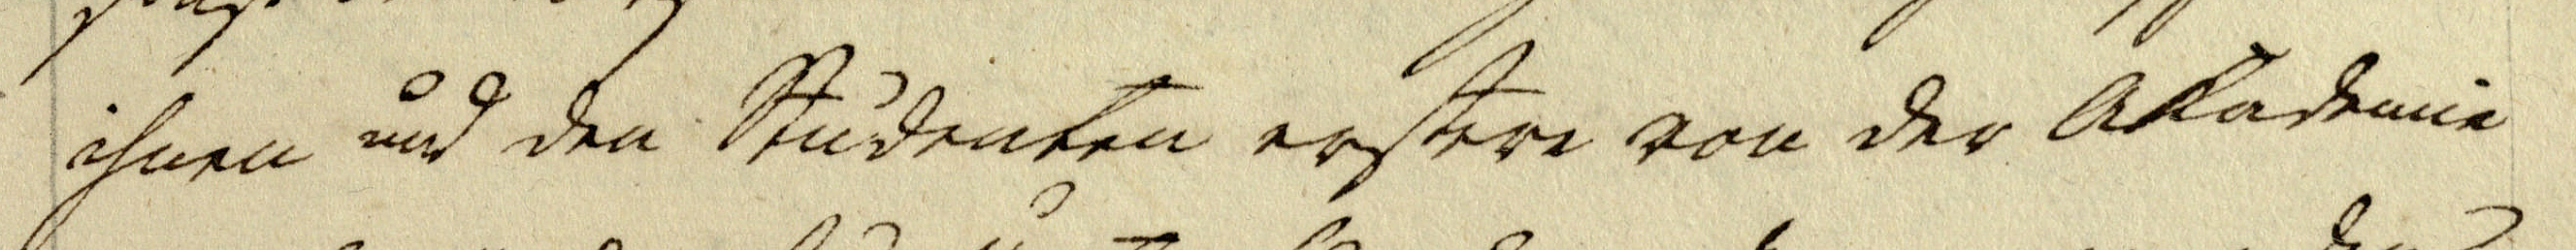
ihnen und den Studenten erstere von der Akademie
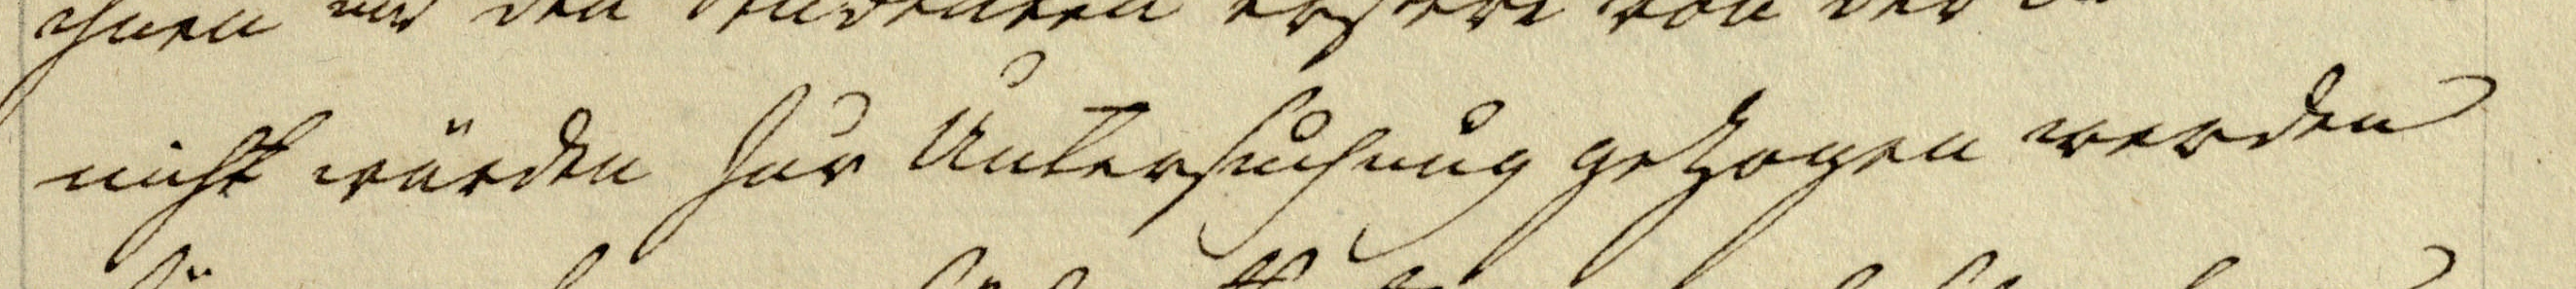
nicht würden zur Untersuchung gezogen werden
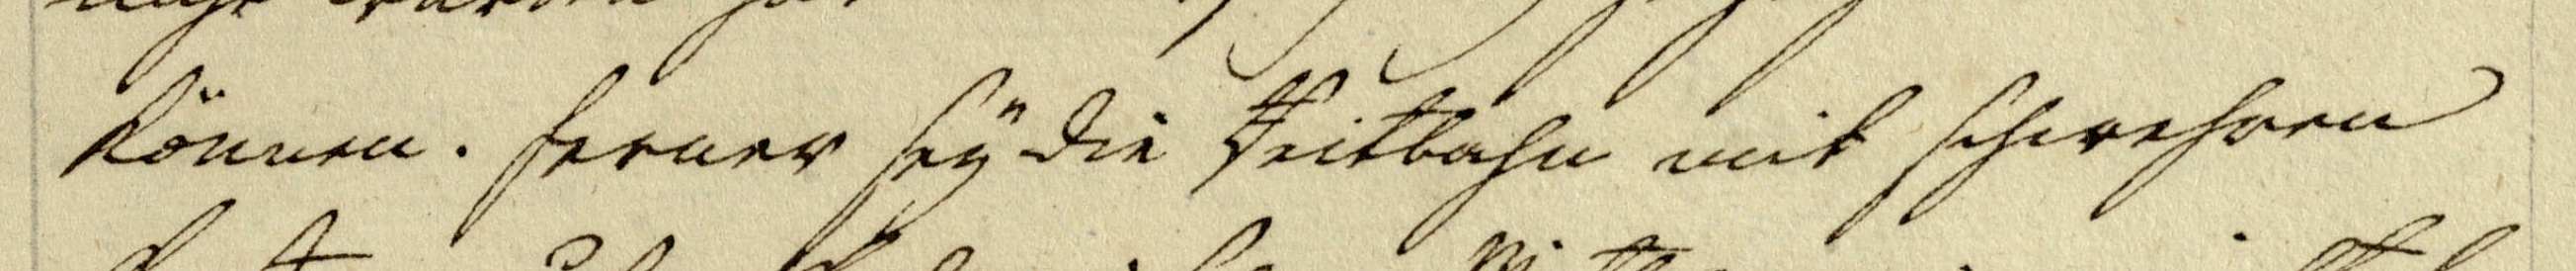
können. Ferner seÿ die Reitbahn mit schwehren
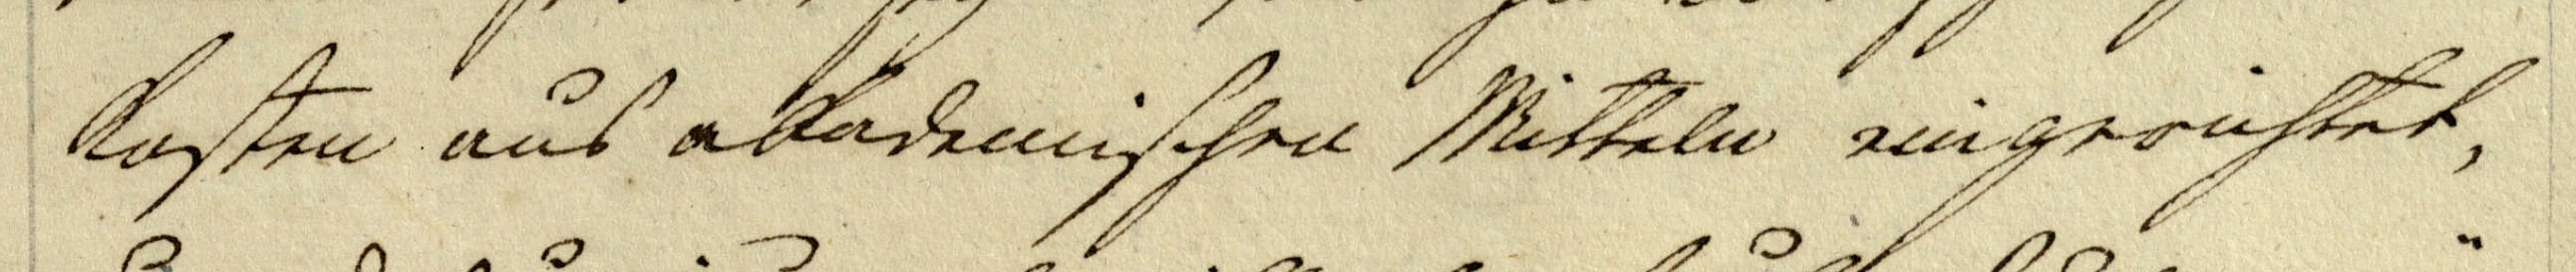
Kosten aus akademischen Mitteln eingerichtet,
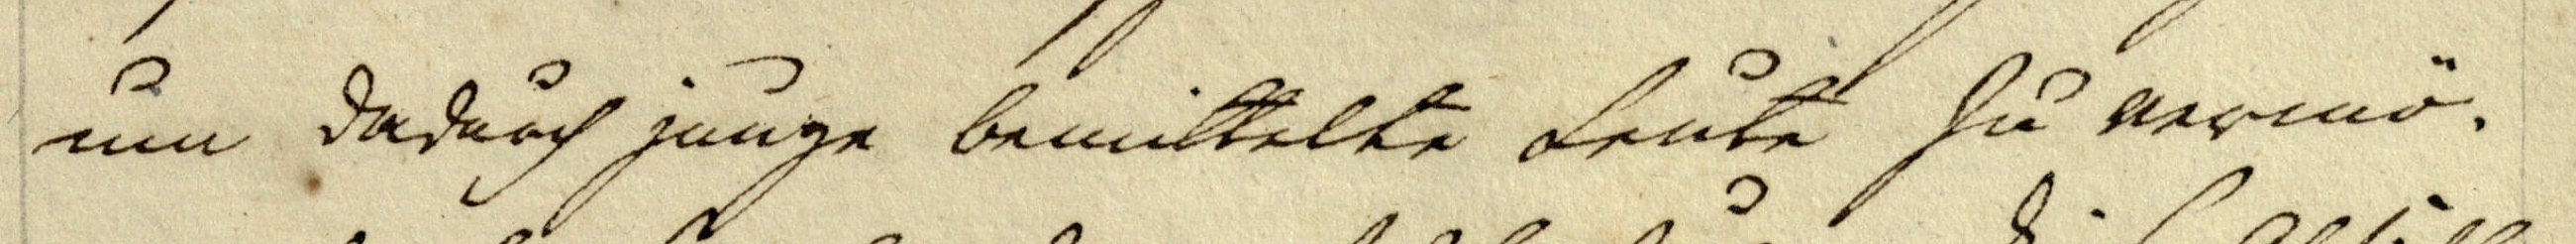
um dadurch junge bemittelte Leute zu vermö¬
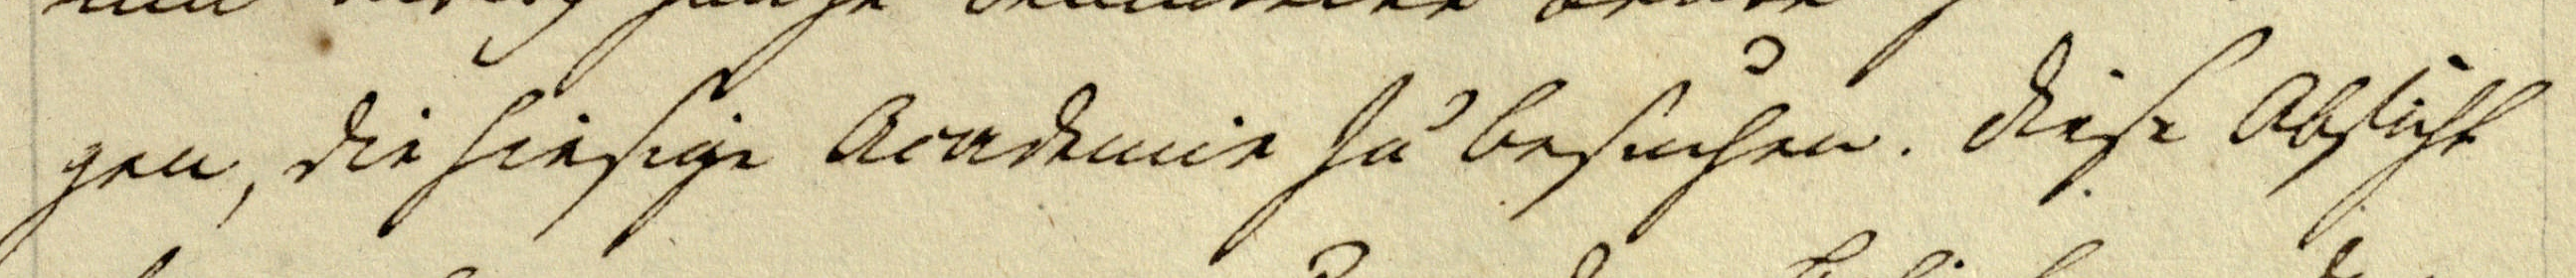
gen, die hiesige Academie zu besuchen. Diese Absicht
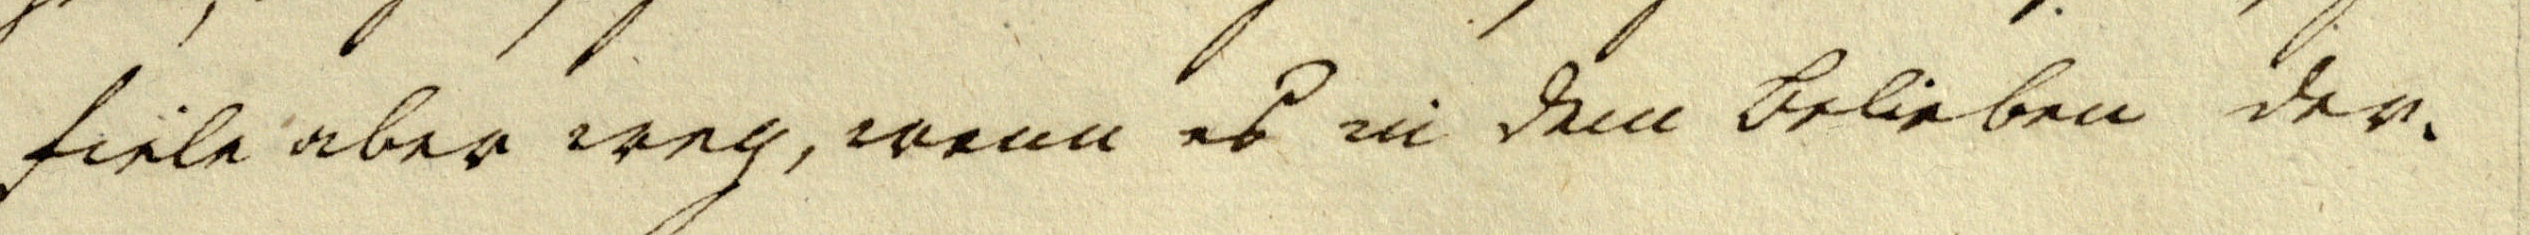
fiele aber weg, wenn es in dem Belieben der¬
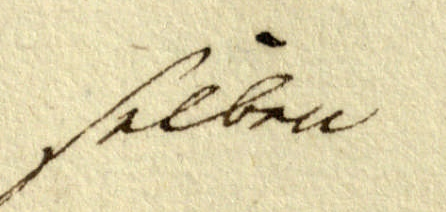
selben
